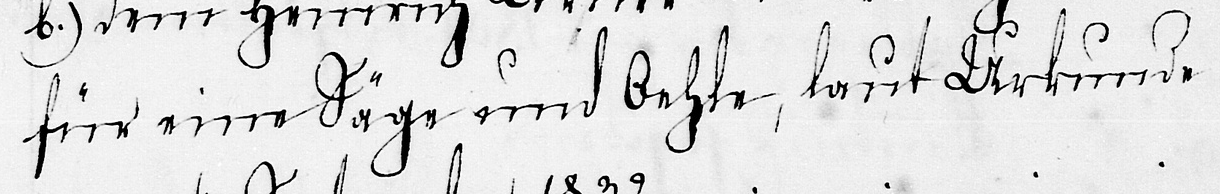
für eine Säge und Oehle, laut Urkunde
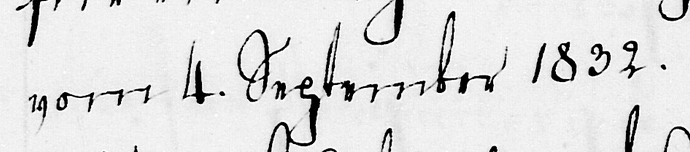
vom 4. September 1832.
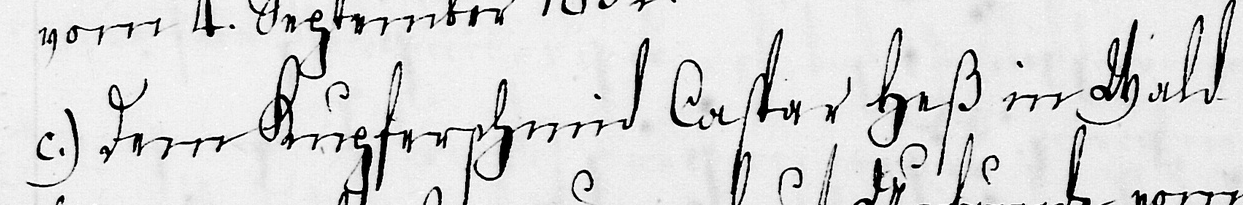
c.) Dem Kupferschmid Caspar Heß in Wald
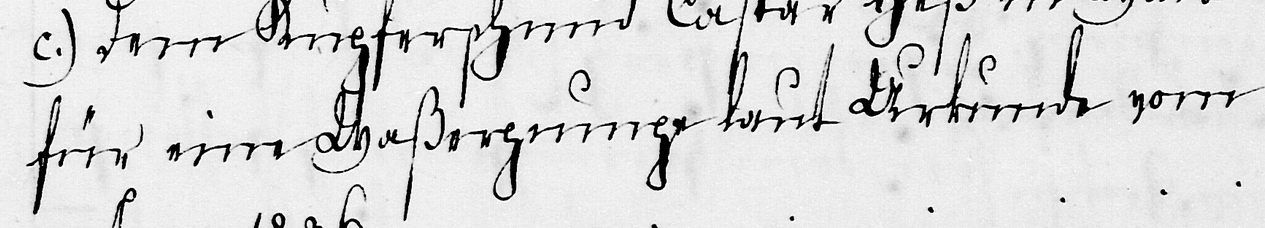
für eine Waßerpumpe laut Urkunde vom
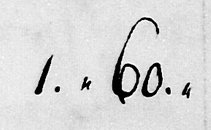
1. “ 60.
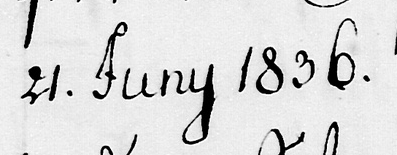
21. Juny 1836.
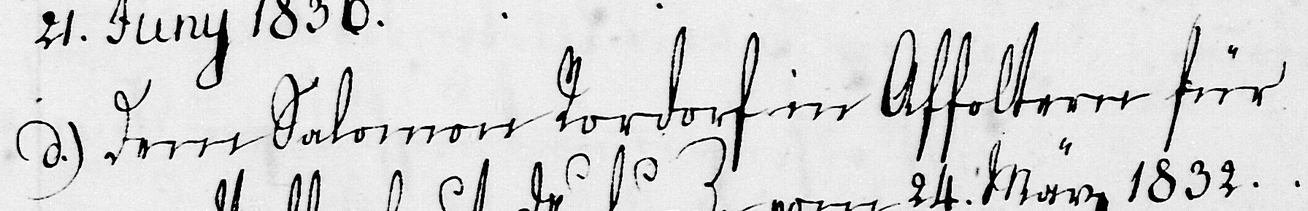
d.) Dem Salomon Rordorf in Affoltern für
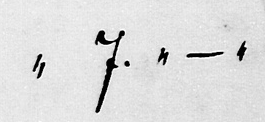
“ 7. “ – “
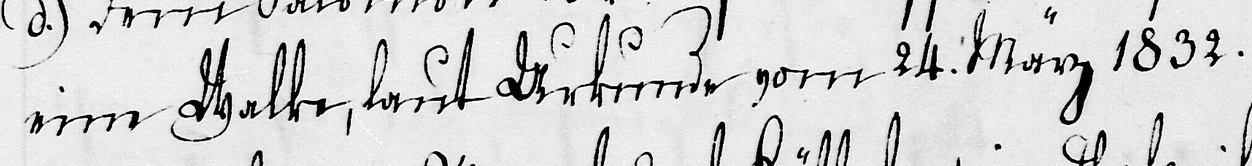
eine Walke, laut Urkunde vom 24. März 1832.
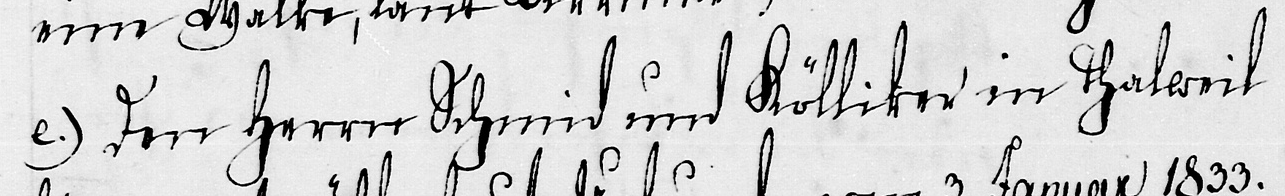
e.) Den Herrn Schmid und Kölliker in Thalweil
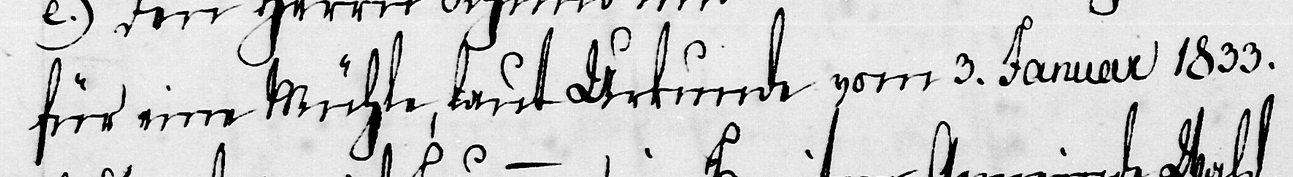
für eine Mühle, laut Urkunde vom 3. Januar 1833.
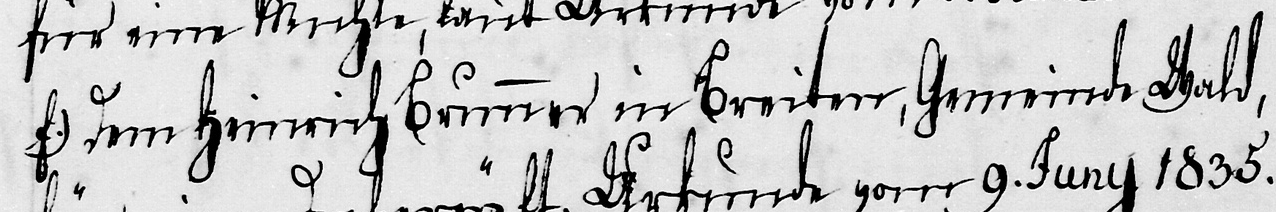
f.) Dem Heinrich Brunner in Breiten, Gemeinde Wald,
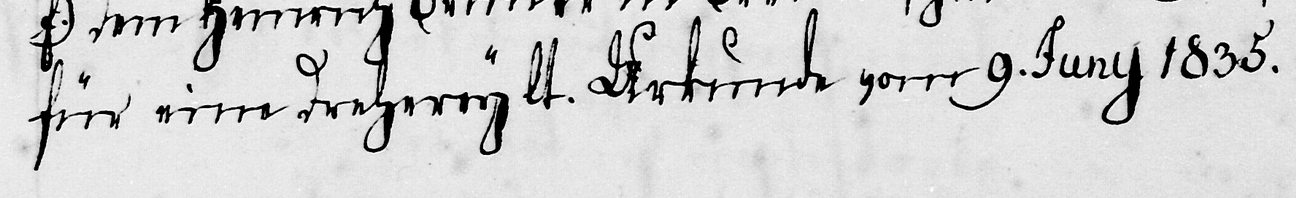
für eine Dreherey lt. Urkunde vom 9. Juny 1835.
